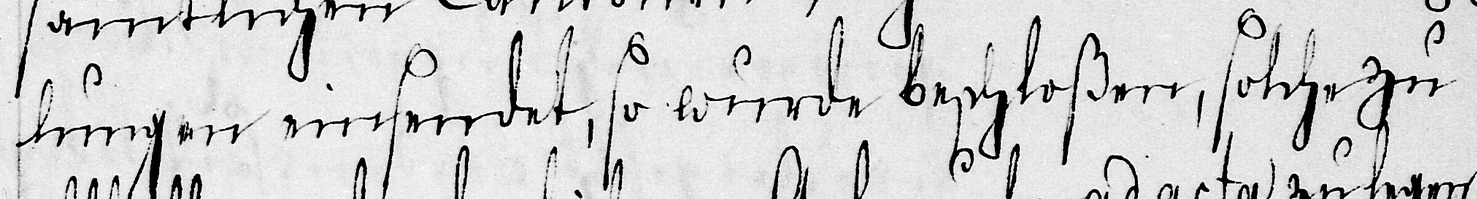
lungen einsendet, so wurde beschloßen, solche zu
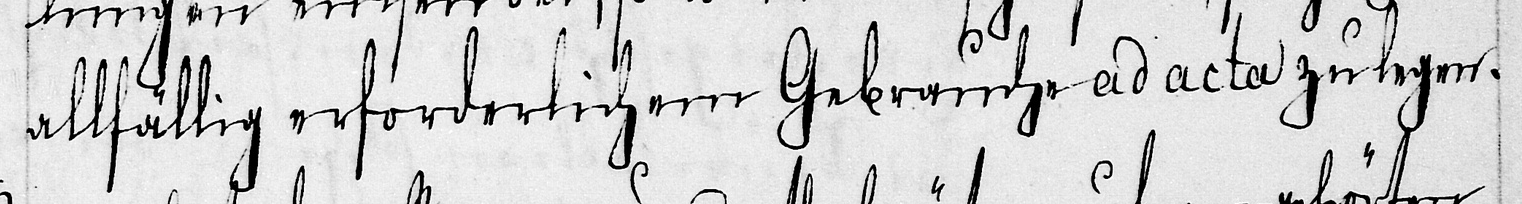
allfällig erforderlichem Gebrauche ad acta zu legen.
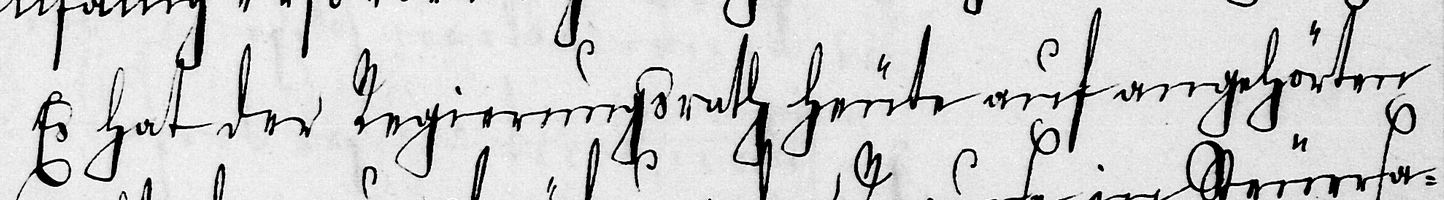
Es hat der Regierungsrath heute auf angehörten
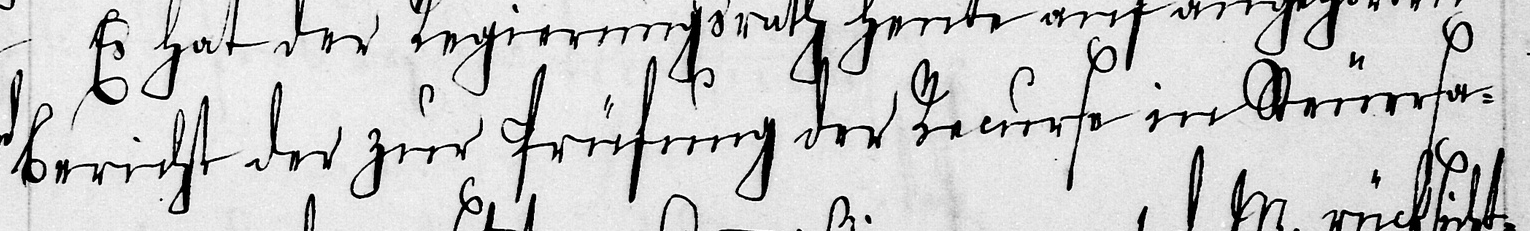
Bericht der zur Prüfung der Recurse in Steuersa¬
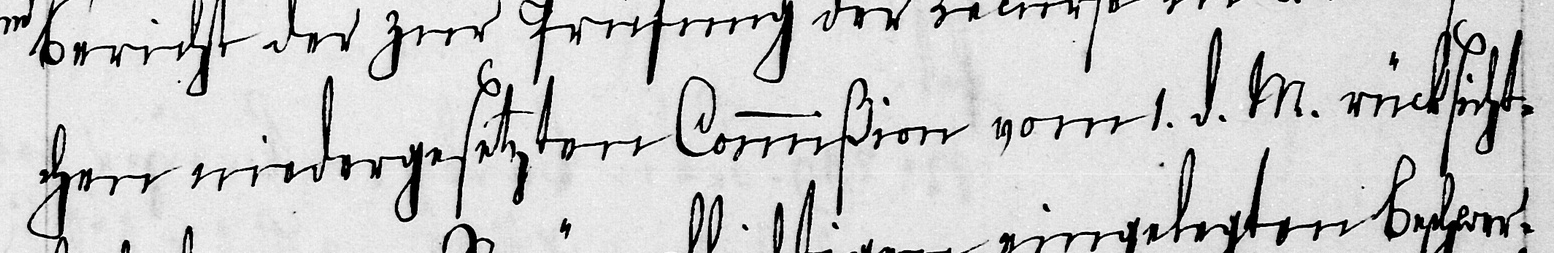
chen niedergesetzten Commißion vom 1. d. M. rücksicht¬
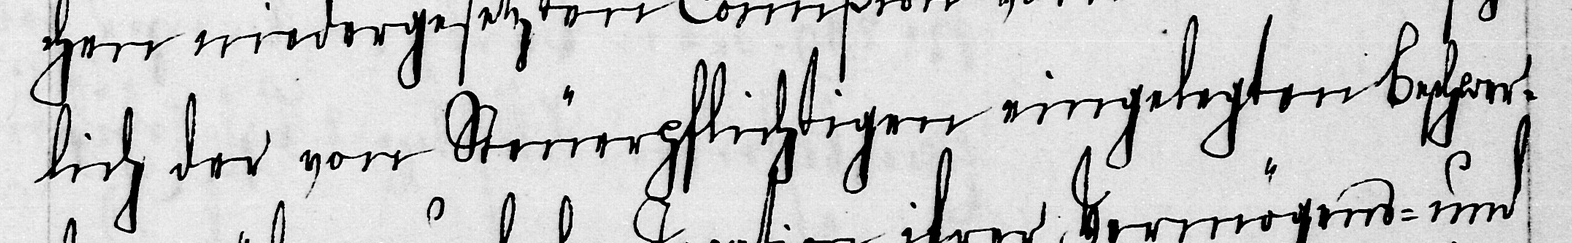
lich der von Steuerpflichtigen eingelegten Beschwer¬
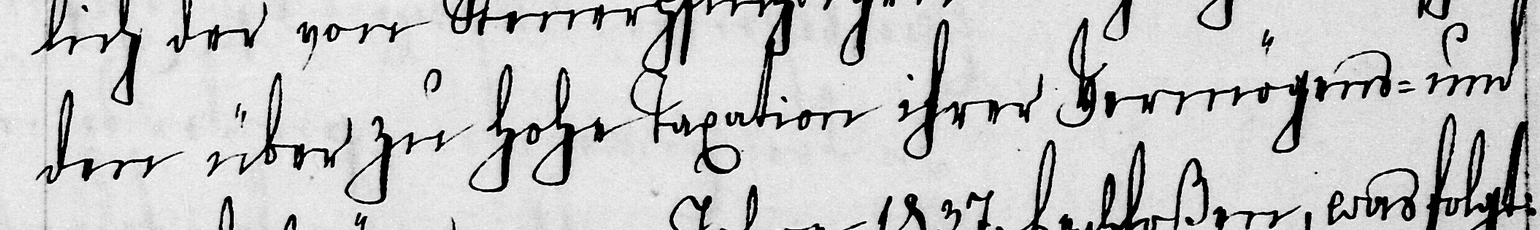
den über zu hohe Taxation ihrer Vermögens- und
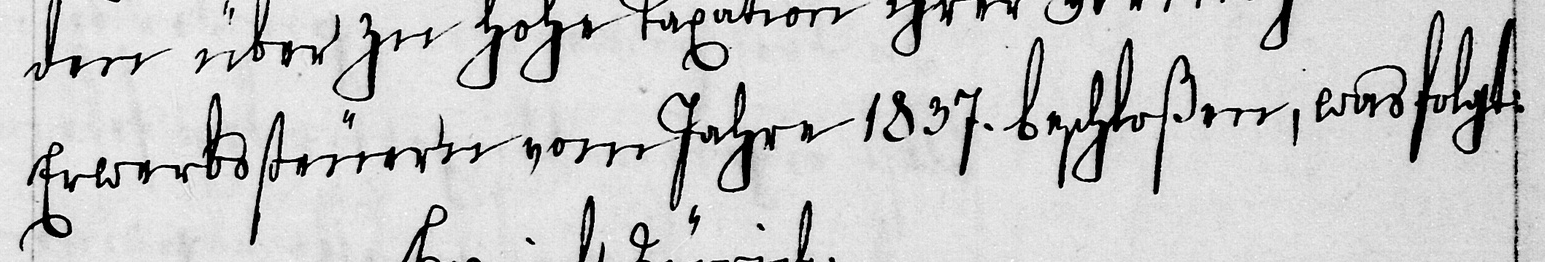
Erwerbssteuern vom Jahre 1837. beschloßen, was folgt:
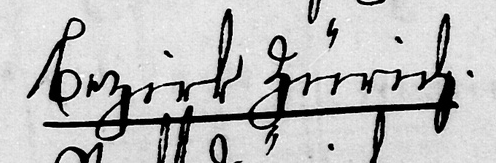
Bezirk Zürich.
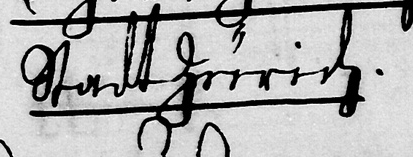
Stadt Zürich.
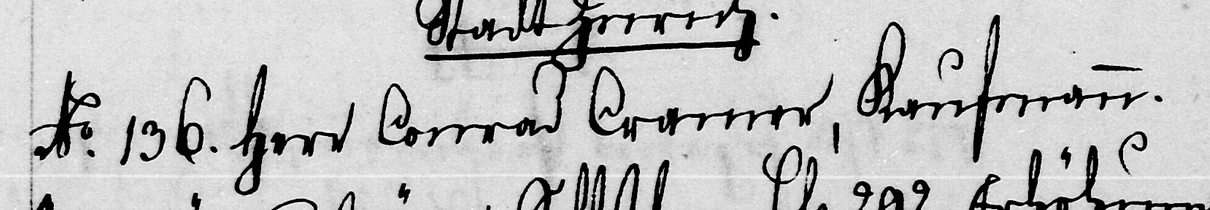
No. 136. Herr Conrad Cramer, Kaufmann.
